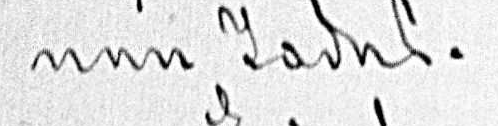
nen Todes.
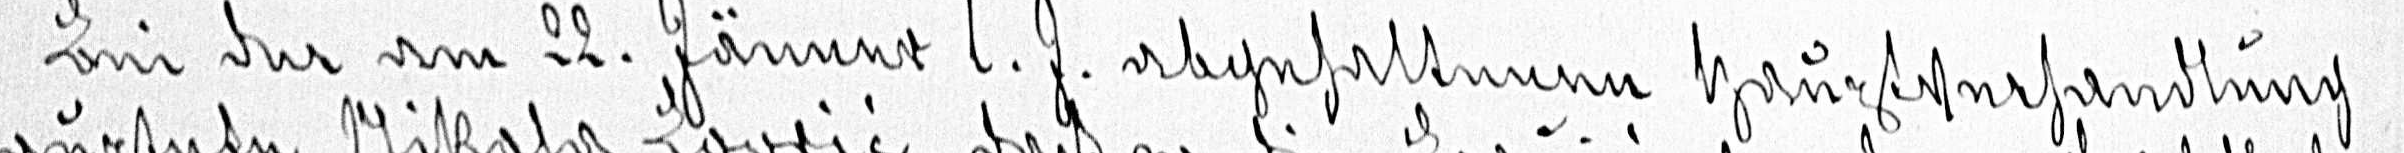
Bei der am 22. Jänner l. J. abgehaltenen Hauptverhandlung
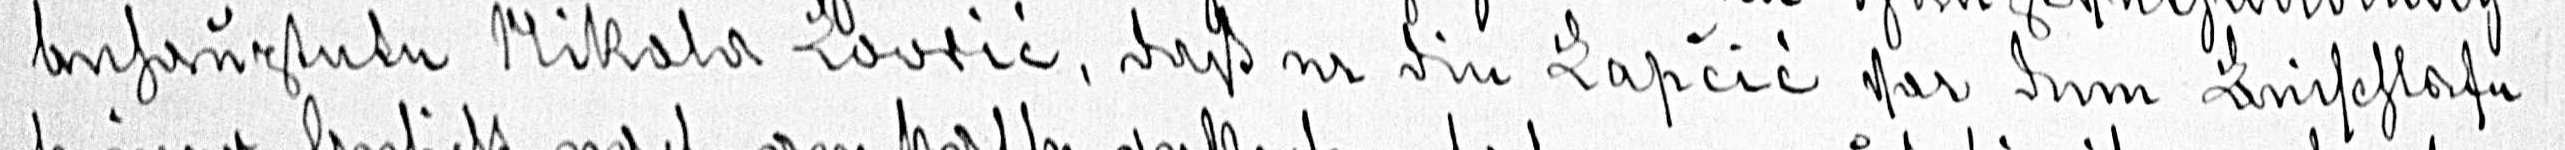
behauptete Nikola Lovrić, daß er die Lapčić vor dem Beischlafe
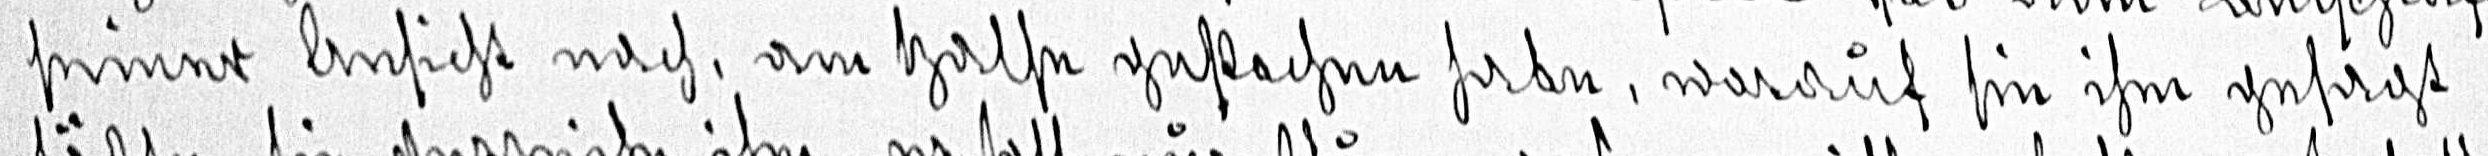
seiner Ansicht nach, am Halse gestochen habe, worauf sie ihm gesagt
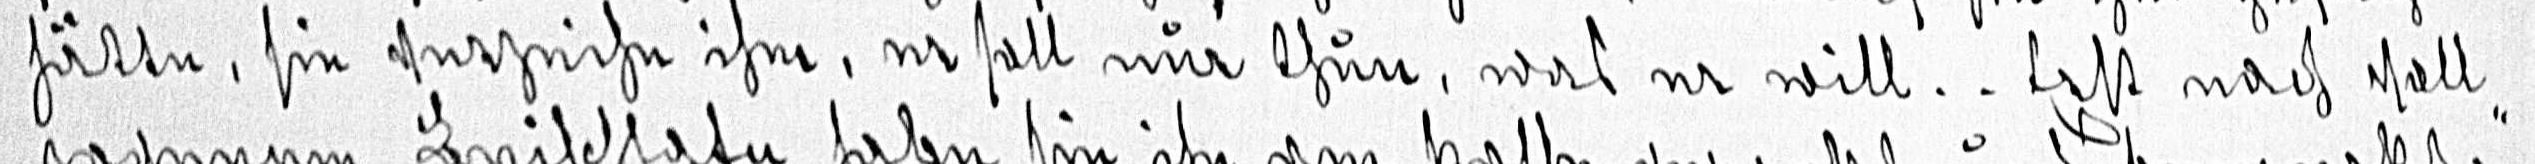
hätte, sie verzeihe ihm, er soll nur thun, was er will. Erst nach voll¬
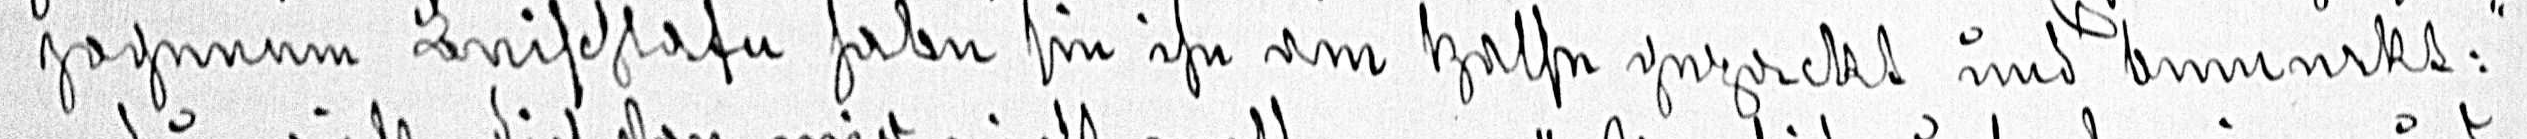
zogenem Beischlafe habe sie ihn am Halse gepackt und bemerkt:
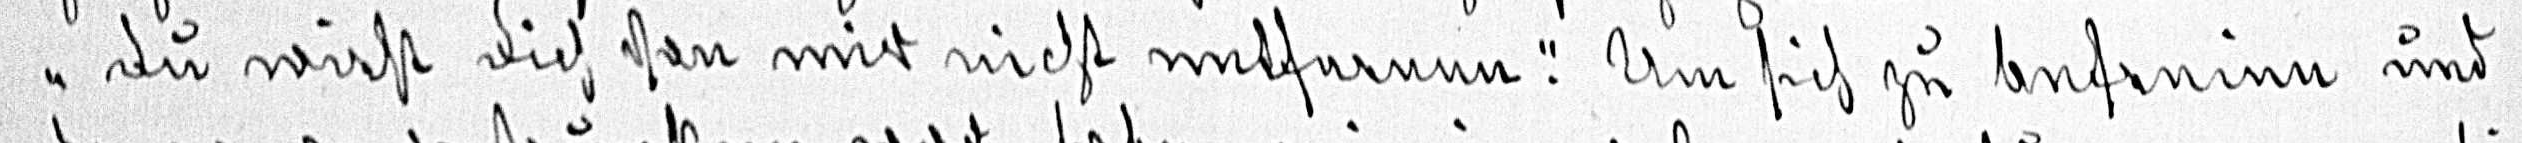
„Du wirst dich von mir nicht entfernen.“ Um sich zu befreien und
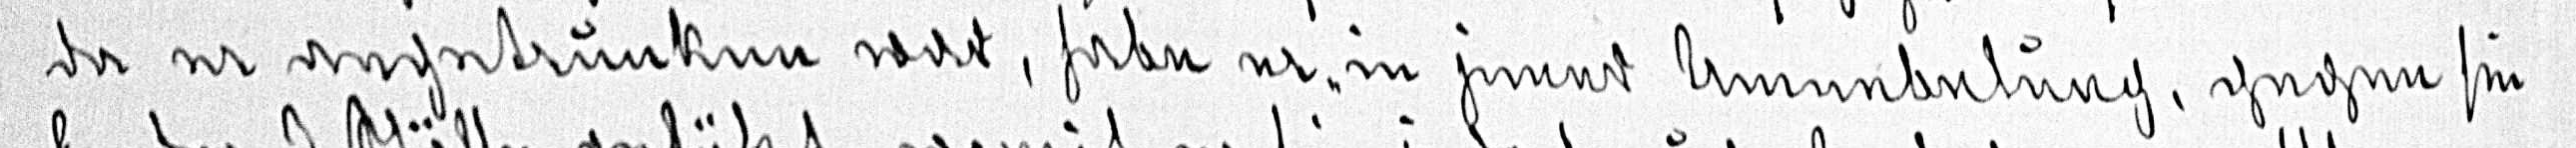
da er angetrunken war, habe er „in jener Umnebelung, gegen sie
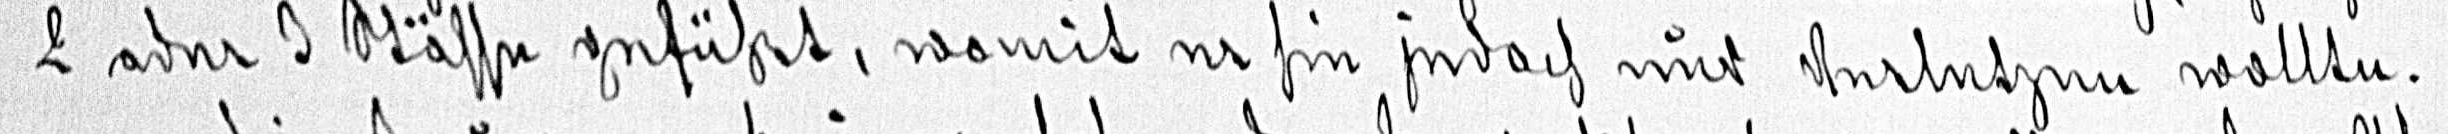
2 oder 3 Stösse geführt, womit er sie jedoch nur verletzen wollte.
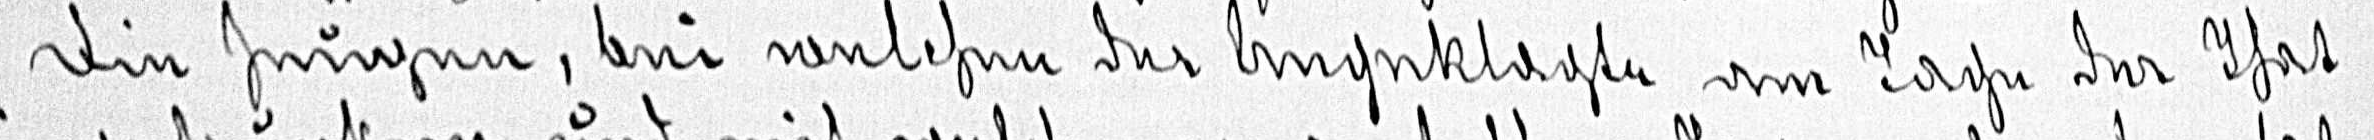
Die Zeugen, bei welchen der Angeklagte am Tage der That
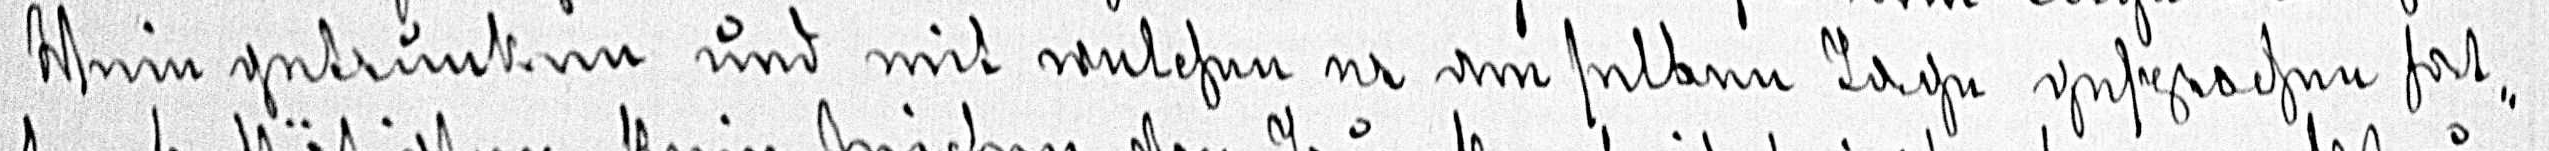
Wein getrunken und mit welchen er am selben Tage gesprochen hat¬
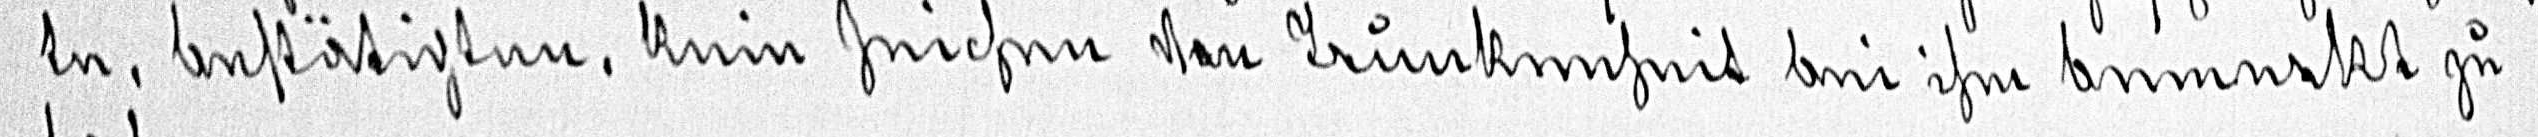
te, bestätigen, kein Zeichen von Trunkenheit bei ihm bemerkt zu
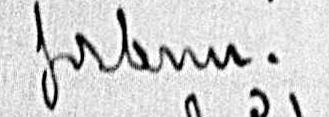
haben.
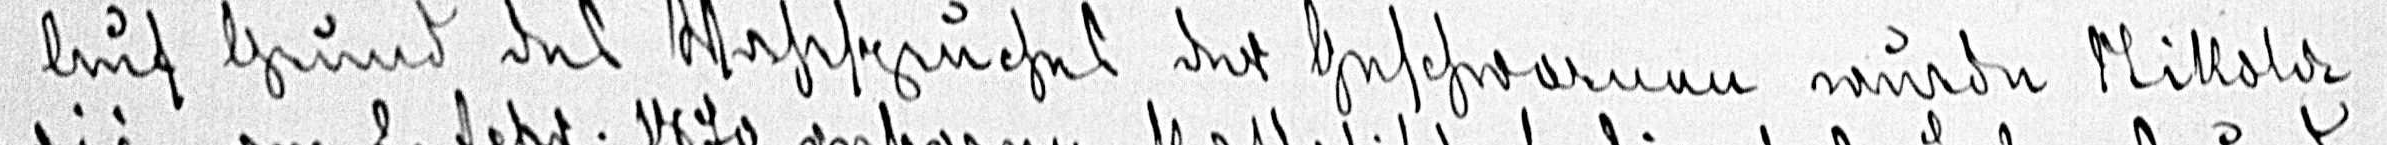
Auf Grund des Wahrspruches der Geschworene wurde Nikola
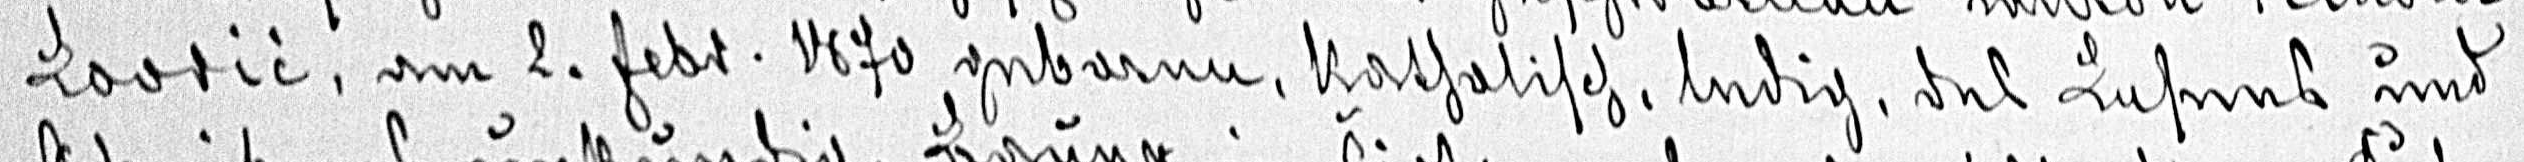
Lovrić, am 2. Febr. 1870 geboren, katholisch, ledig, des Lesens und
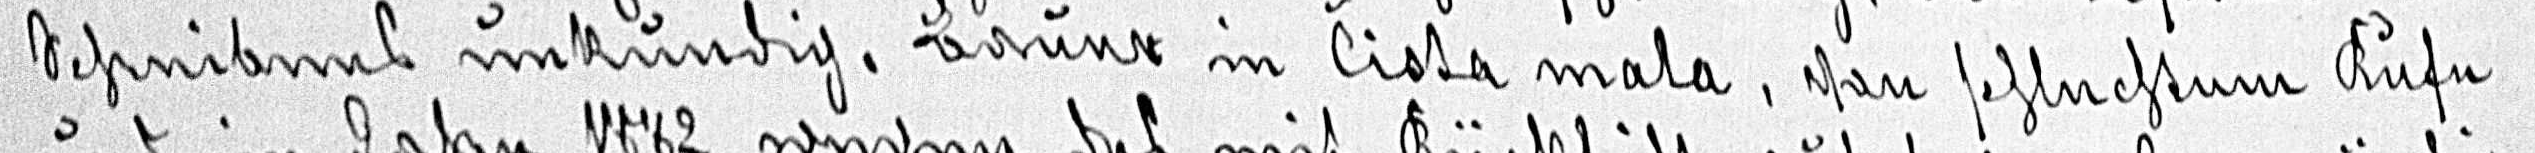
Schreibens unkundig, Bauer in Čista mala, von schlechtem Rufe
